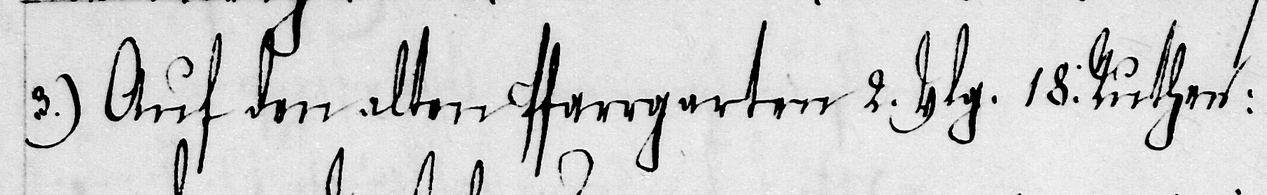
3.) Auf den alten Pfarrgarten 2. Vlg. 18. Ruthen:
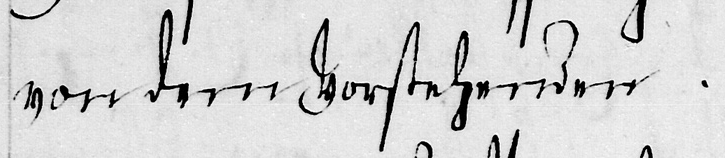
von dem Vorstehenden
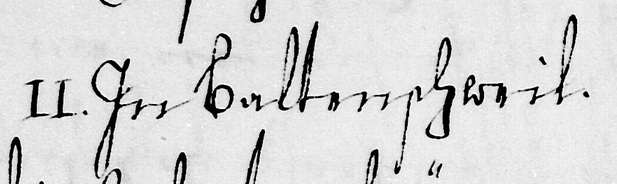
I. In Baltenschweil.
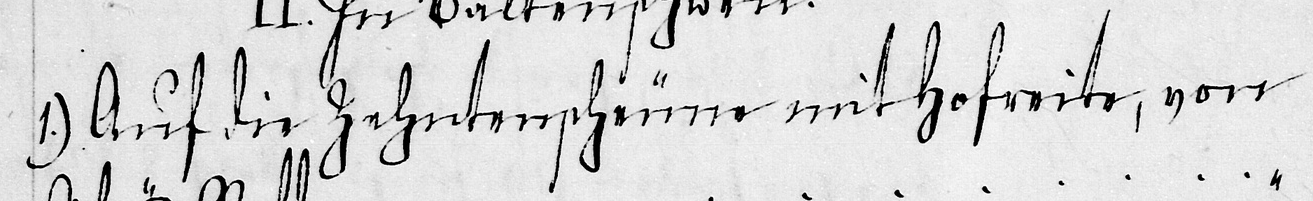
1.) Auf die Zehntenscheune mit Hofreite, von
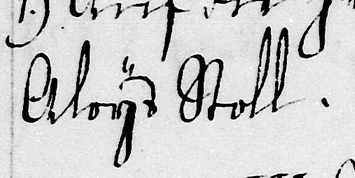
Aloys Stoll
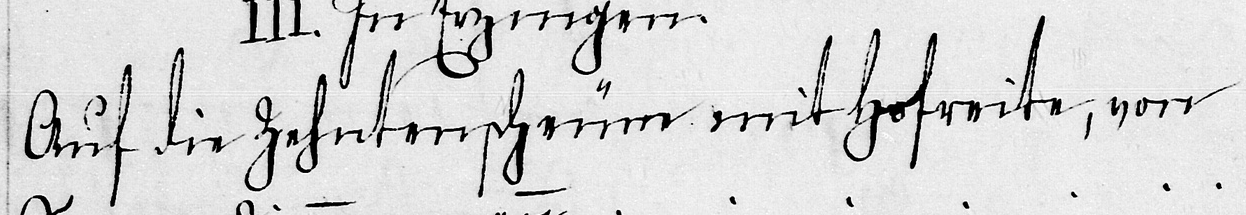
Auf die Zehntenscheune mit Hofreite von
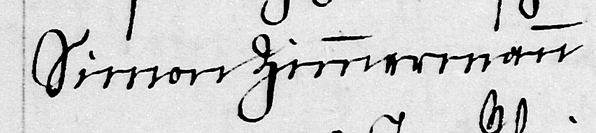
Simon Zimmermann
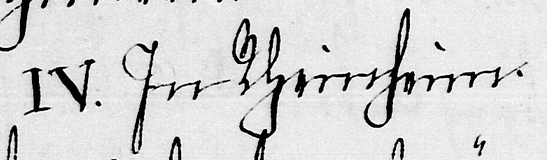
IV. In Rheinheim
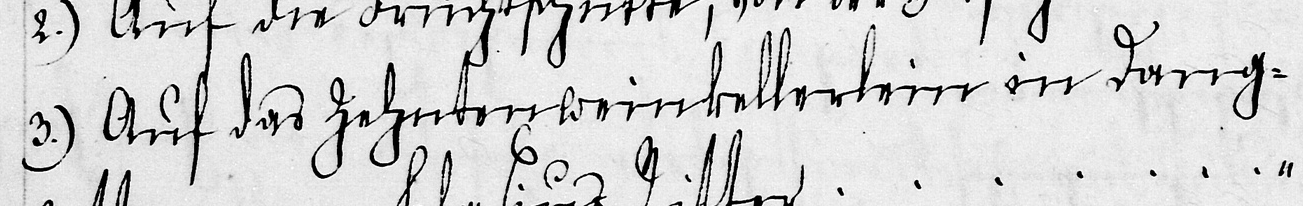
3.) Auf das Zehntenweinkellerlein in Dang¬
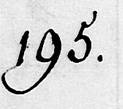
195.
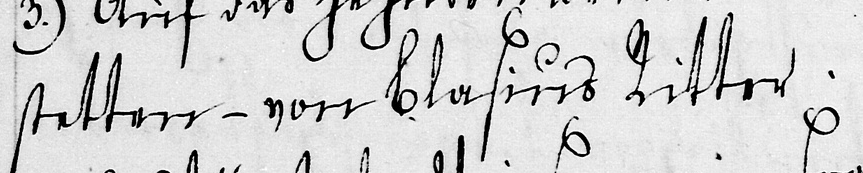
stetten – von Blasius Ritter
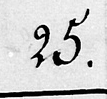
25.
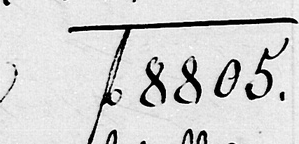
fl. 8805.
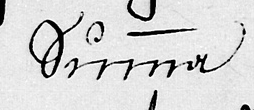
Summa
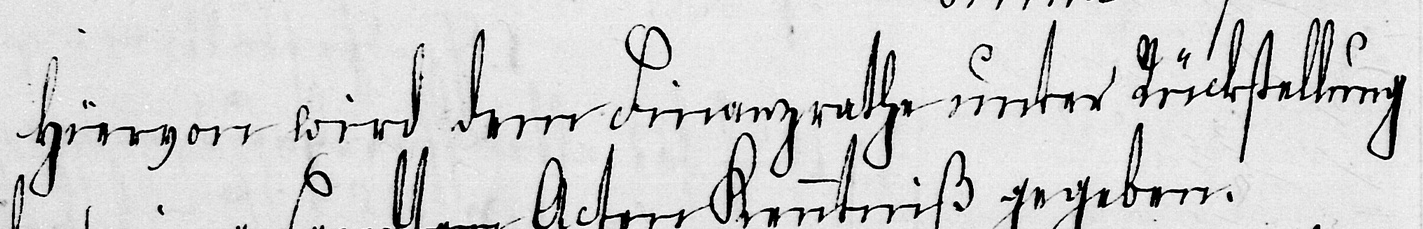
Hiervon wird dem Finanzrathe unter Rückstellung
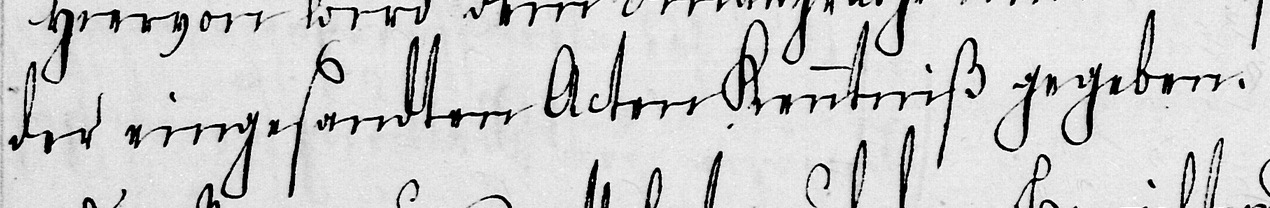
der eingesandten Acten Kenntniß gegeben.
